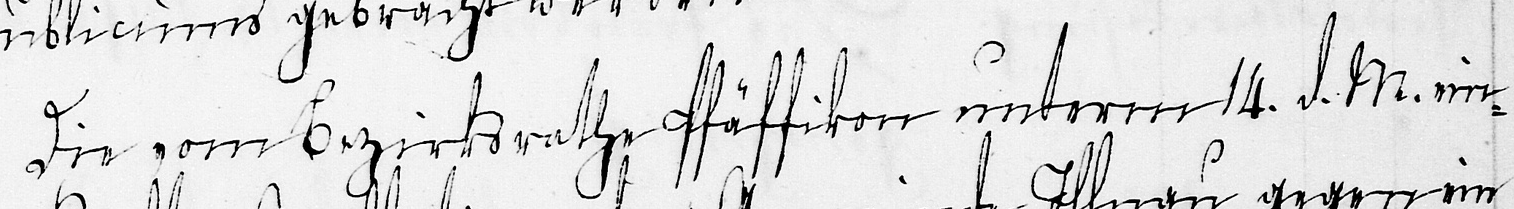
Die vom Bezirksrathe Pfäffikon unterm 14. d. M. ein¬
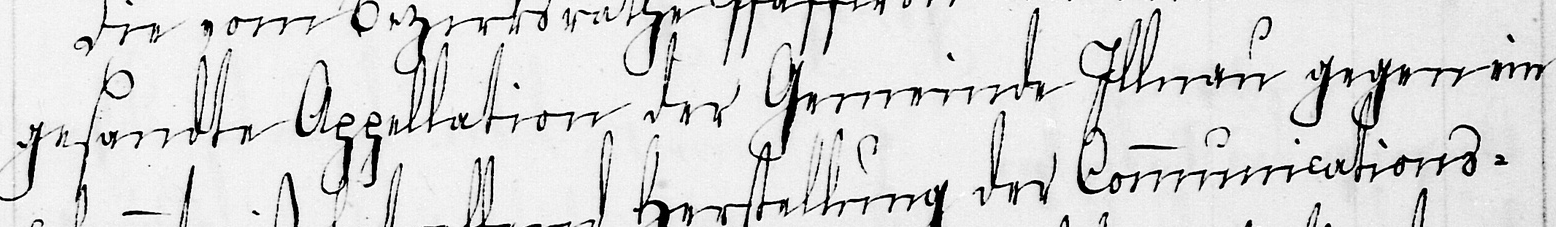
gesandte Appellation der Gemeinde Illnau gegen ein
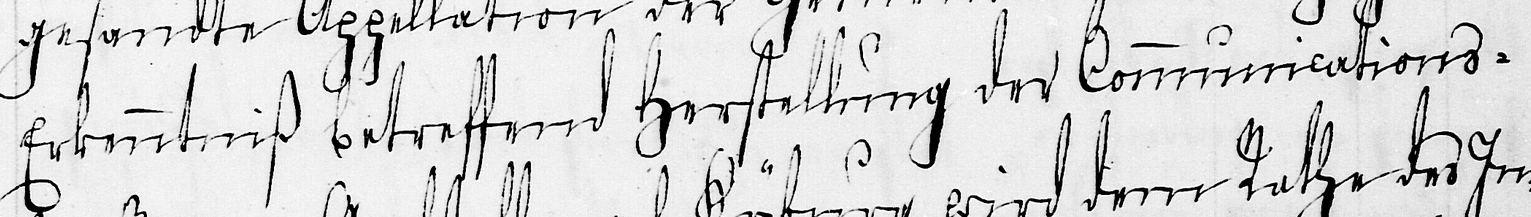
Erkenntniß betreffend Herstellung der Communications¬
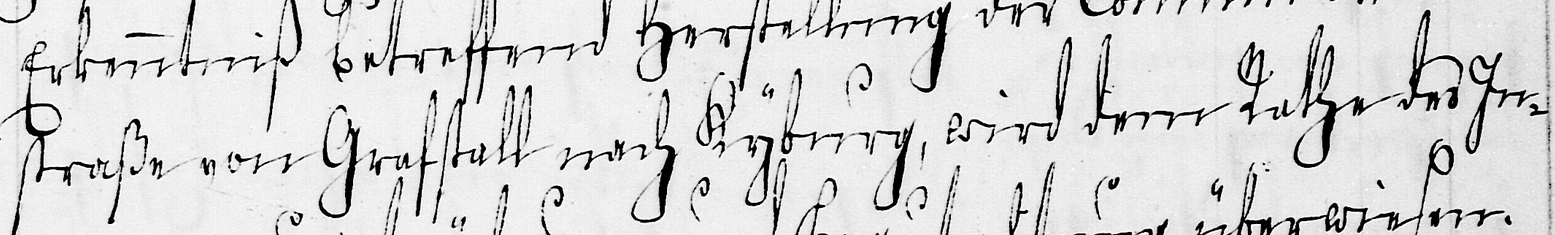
straße von Grafstall nach Kyburg, wird dem Rathe des In¬
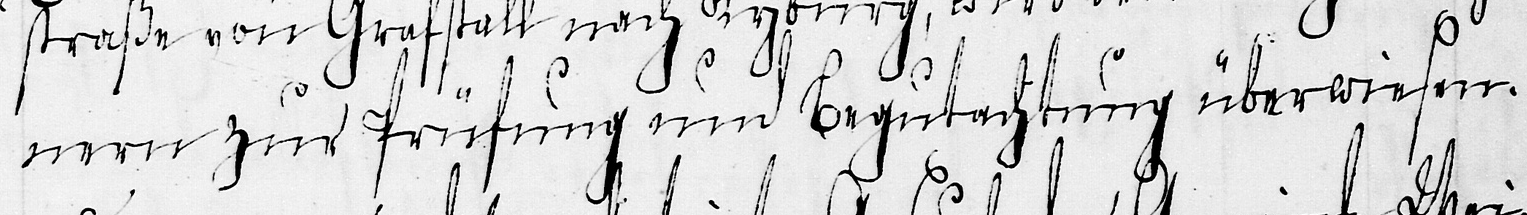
nern zur Prüfung und Begutachtung überwiesen.
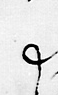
5.
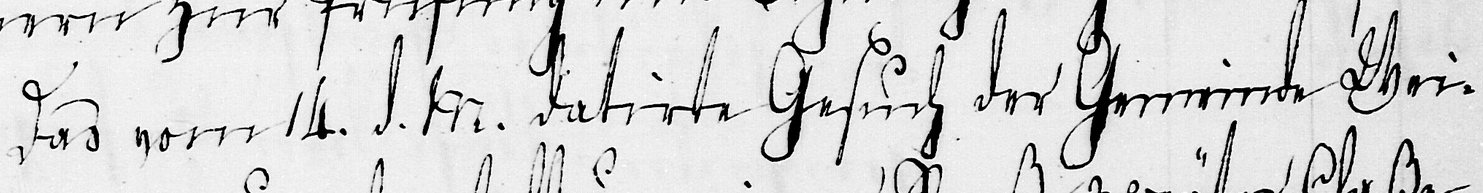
Das vom 14. d. M. datirte Gesuch der Gemeinde Wei¬
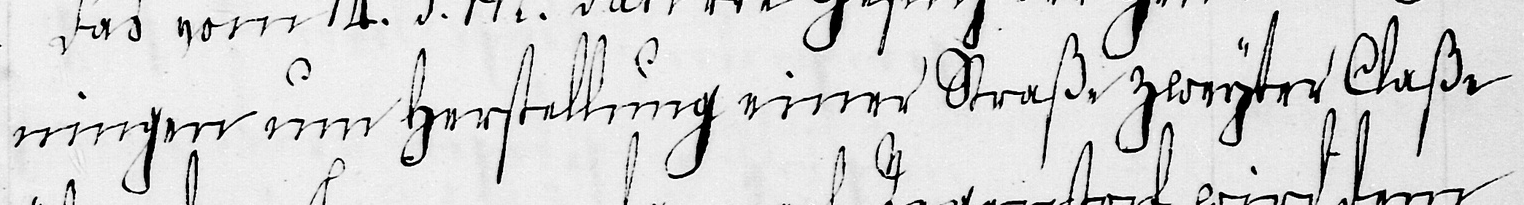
ningen um Herstellung einer Straße zweyter Claße
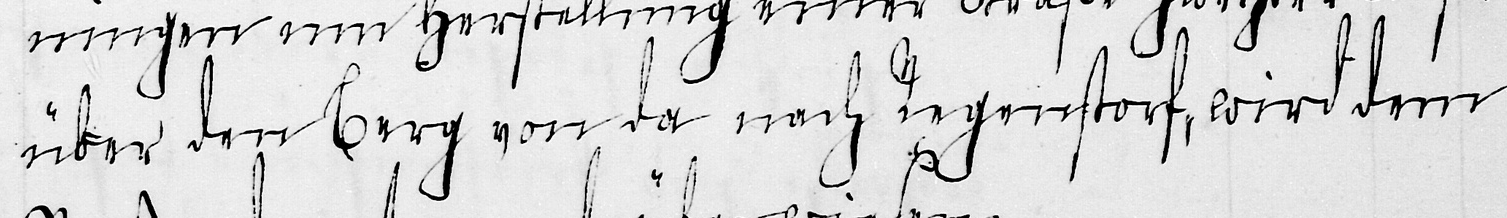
über den Berg von da nach Regenstorf, wird dem
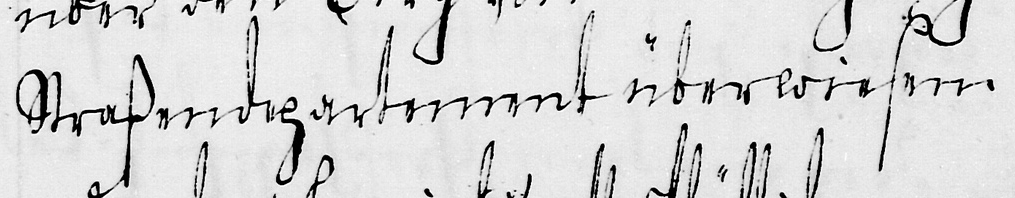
Straßendepartement überwiesen.
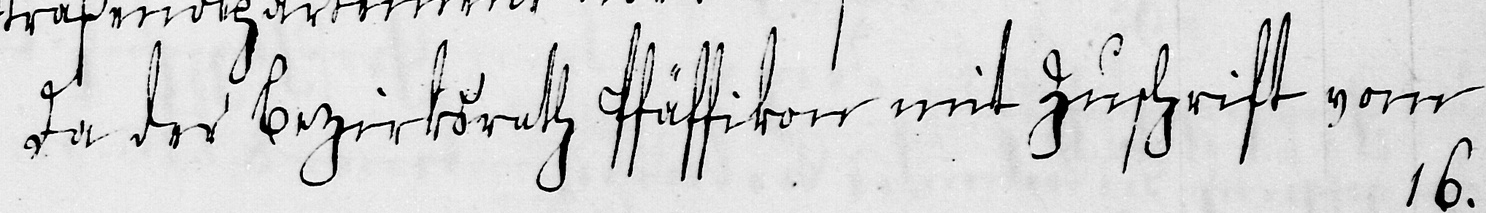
Da der Bezirksrath Pfäffikon mit Zuschrift vom
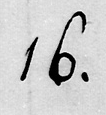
10.
